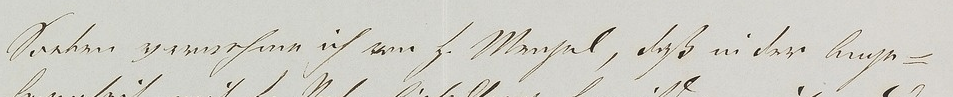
Soeben vernehme ich von H. Menzel, dass in der Ange-
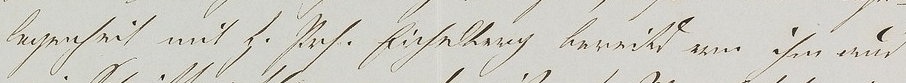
legenheit mit H. Prf. Eichelberg bereits von ihm aus
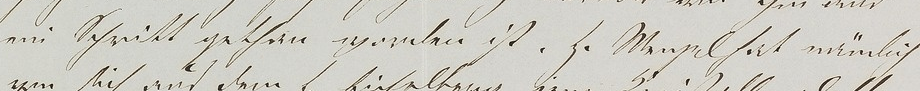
ein Schritt gethan worden ist. H. Menzel hat nämlich
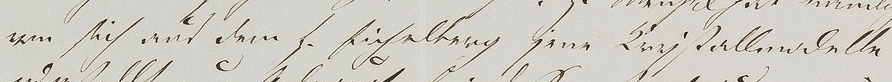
von sich aus dem H. Eichelberg jene Kristallmodelle
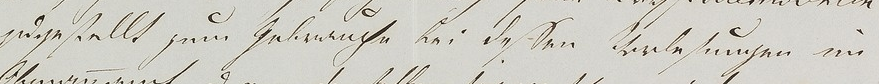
zugestellt zum Gebrauche bei dessen Vorlesungen im
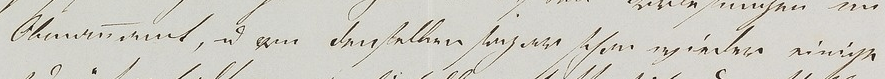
Obmannamt, u von denselben sogar schon wieder einige
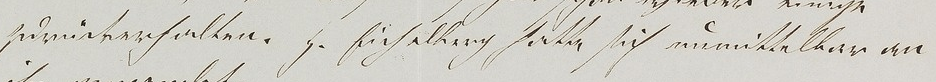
zurückerhalten. H. Eichelberg hatte sich unmittelbar an
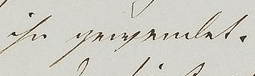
ihn gewendet.
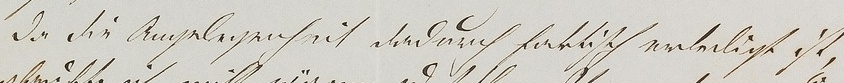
Da die Angelegenheit dadurch faktisch erledigt ist,
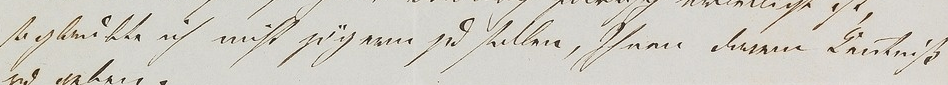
so glaubte ich nicht zögern zu sollen, Ihnen davon Kenntniß
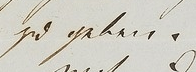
zu geben.
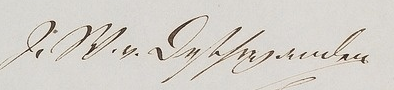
J. W. v. Deschwanden
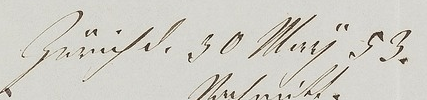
Zürich d. 30 May 53.
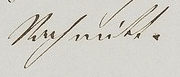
Nachmitt.
